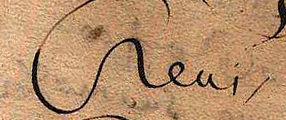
Creui /
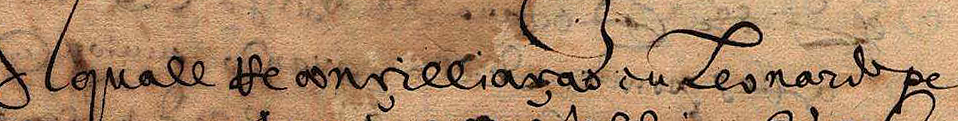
A quall Reconçilliaçaõ eu Leonardo pe
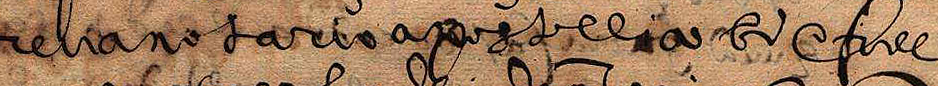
reira notario apostollico bē e fiell
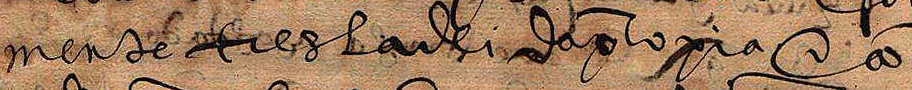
mente tresladei da propia e cō
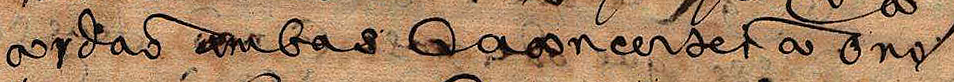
cordaõ ambas e a concertei cō o no
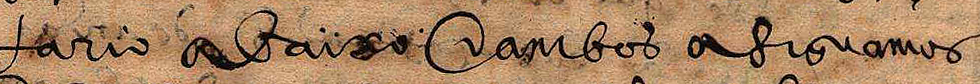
tario abaixo e ambos asignamos
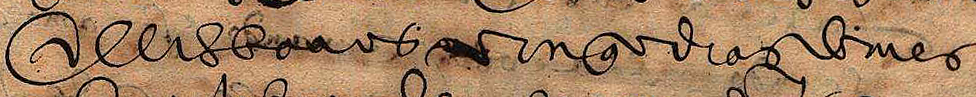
ē llisboa os cinq̄o dias do mes
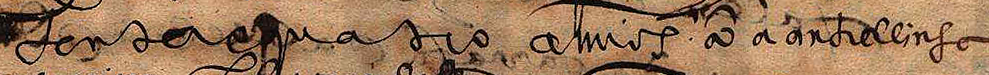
tenta e quatro annos cō a antrellinha
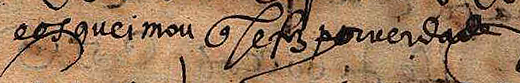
e os queimou q̄ se fez por uerdade
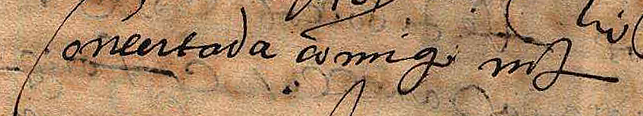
Concertada comigo notrio
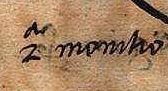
2a monitio
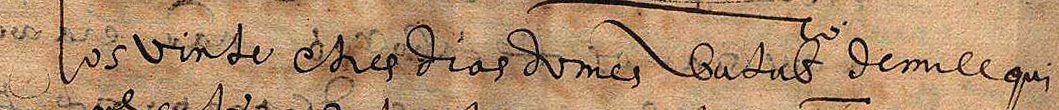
Aos vinte e tres dias do mes doutubro de mill qui
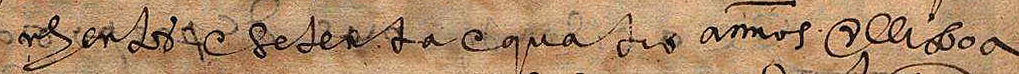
nhentos e setenta e quatro annos ē llisboa
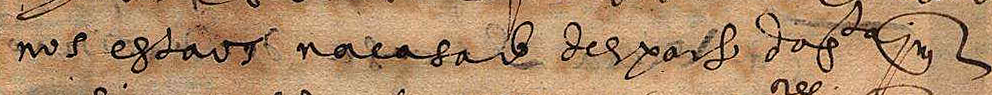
nos estaos na casa do despacho da sta Jm
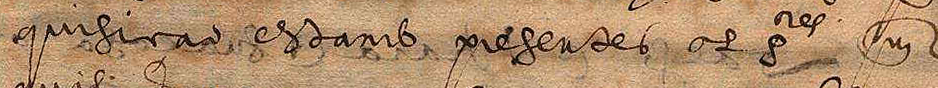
quisiçaõ estando presentes os sores im
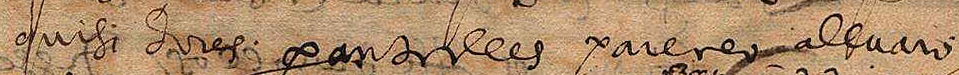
quisidores ꝑante elles pareceo alluaro
